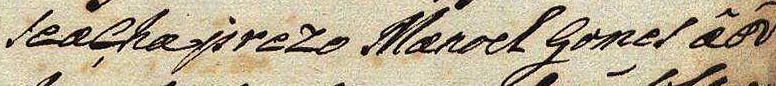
se acha prezo Manoel Gomes á or
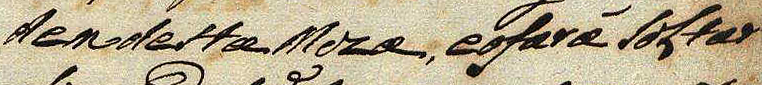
dem desta Meza, e o fará soltar
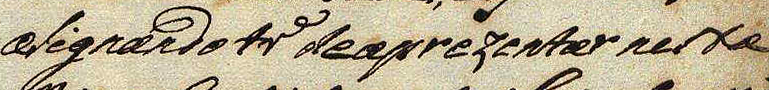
asignando tr.o de aprezentar nesta
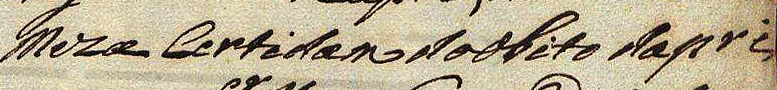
Meza certidam do obito da pri
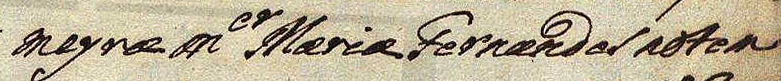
meyra m.er Maria Fernandes ao tem
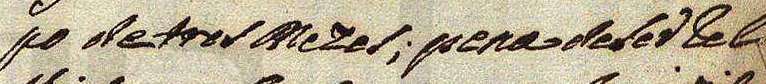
po de tres mezes; pena de ser ReC
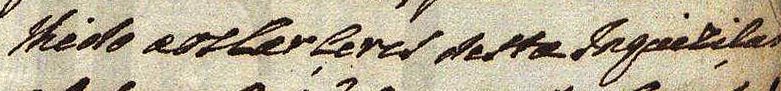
lhido aos CarÇeres desta Inquiziçao
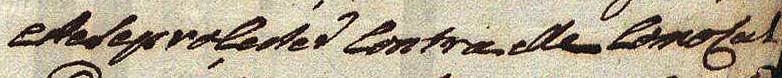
e de se proÇeder Contra elle Como Cul
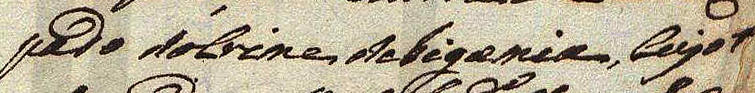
pado do Crime de bigamia, Cujo
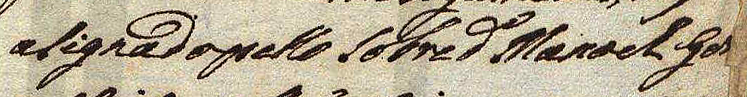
asignado pello sobred.o Manoel Gon
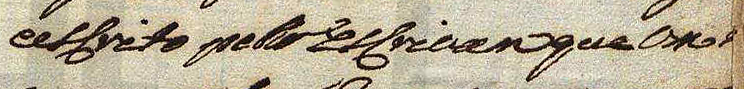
e esCrito pello EsCrivam que v m.
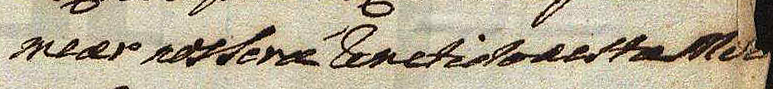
mear nos será Remetido desta Mez
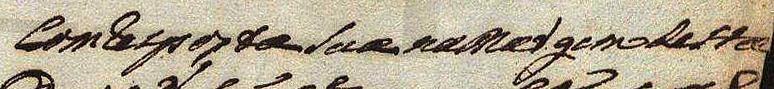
com Resposta sua na Margem desta
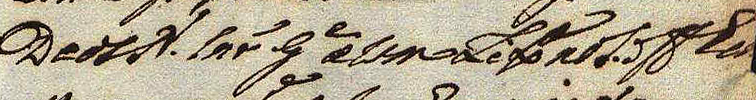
Deos N. snr̄ G.e a v m Lxa no S. off. Em
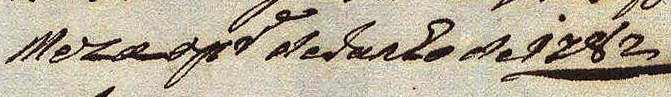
Meza o pr.o de Iunho de i782
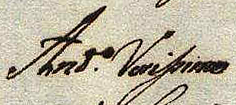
Ant.o Verissimo
